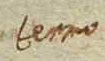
termo
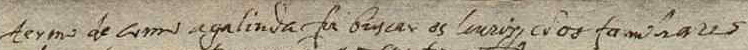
termo de como a galinda foi buscar os liuros cō os familiares
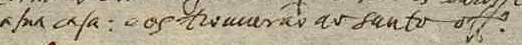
a sua casa: e os trouueraõ ao santo offo
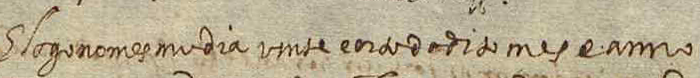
E logo no mesmo dia vinte e oito do dito mes e anno
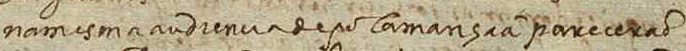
na mesma audiencia de pola manhaā pareceraõ
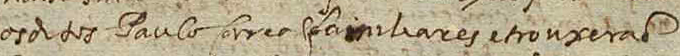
os ditos Paulo Correa e familiares e trouxeraõ
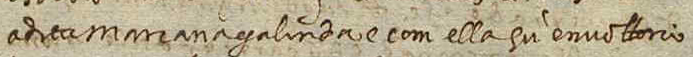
a dita mariana galinda e com ella hū enuoltorio
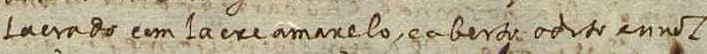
lacrado com lacre amarelo, e aberto o dito enuol
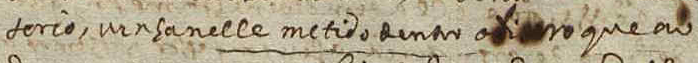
torio, uinha nelle metido dentro o liuro que ao
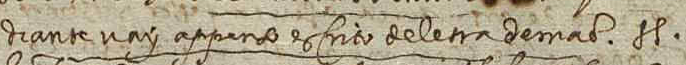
diante uay appenso esCrito de letra de maõ. ss.
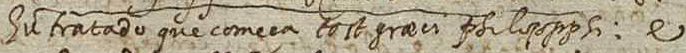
hū tratado que começa tost græci philosopphi: e
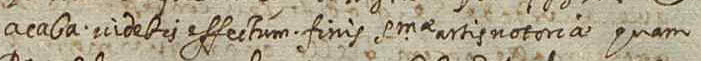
acaba uidebis effectum. finis, s.mæ artis notoria quam
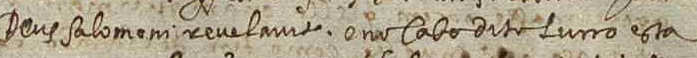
Deus salomoni reuelauit. e no Cabo dito Liuro esta
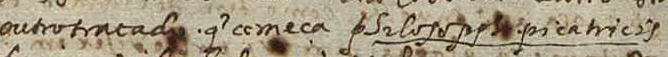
outro tratado q̄ começa philosopph. picatricis
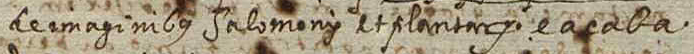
de imaginibꝯ Salomonis et plantarꝭ, e acaba
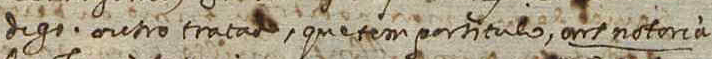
digo. outro tratado, que tem por titulo, ars notoriā
